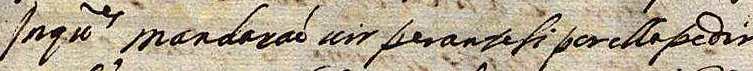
Inqures mandaraõ uir perante si por ella pedir
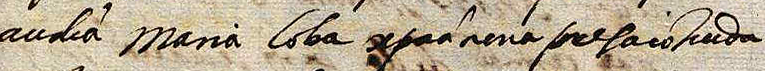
audiā maria Loba xpaã noua presa cōteuda
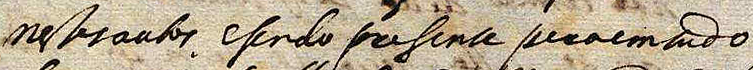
nestes autos, e sendo presente pera em tudo
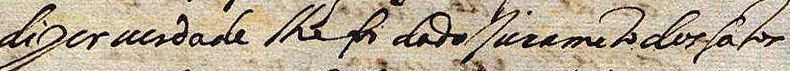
dizer uerdade lhe foi dado Juramēto dos sātos
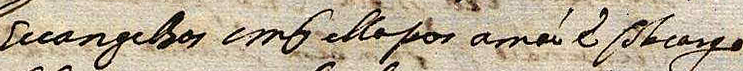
Euangelhos em q̄ ella pos a maõ & sob cargo
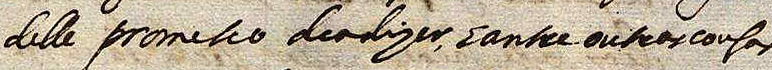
delle prometeo de o dizer, E antre outras cousas
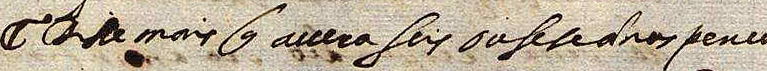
¶ Disse mais q̄ auera seis ou sete an̄os pouco
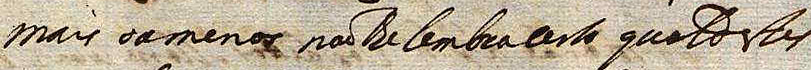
mais ou menos naõ lhe lembra certo qual destes
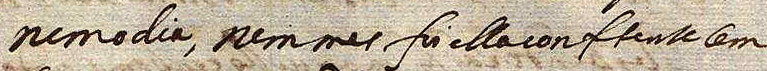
nem o dia, nem mes foi ella confitente com
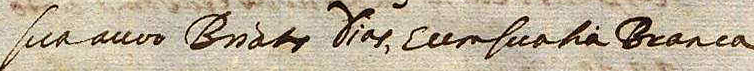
sua auvo Briatis Dias, E com sua tia Branca
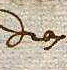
dias
